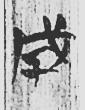成
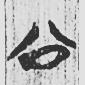公
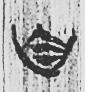自
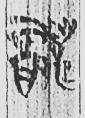{酉萬}
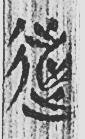逃
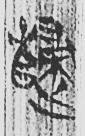歸
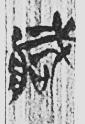戕
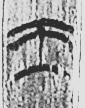王
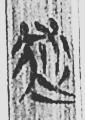述
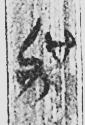加
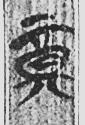奠
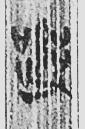{𤔔㗊}
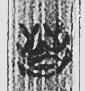晉
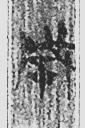成
